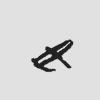女
